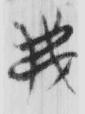弗
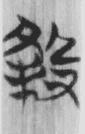{夆殳}
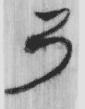乃
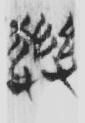彝
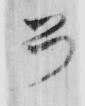乃
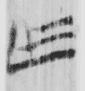乍
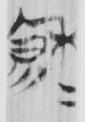穆
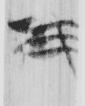隹
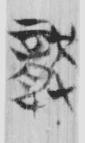{𦚏兄廾}
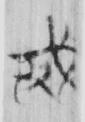威
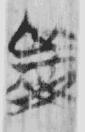義
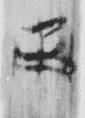甬
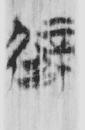辟
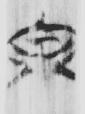余
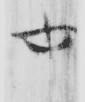才
